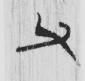父
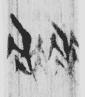{拜L}
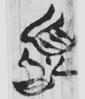旨頁=
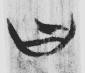曰
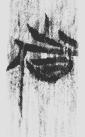者
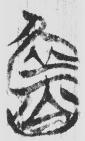魯
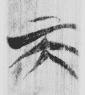天
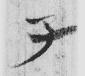子
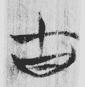古
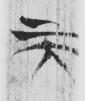天
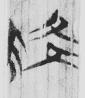降
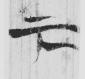下
